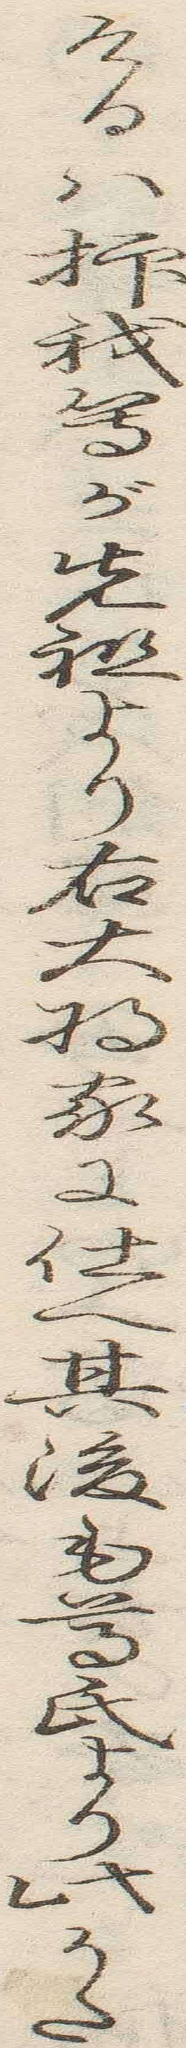けるは抑我等が先祖より右大将家に仕へ其後も尊氏より此かた
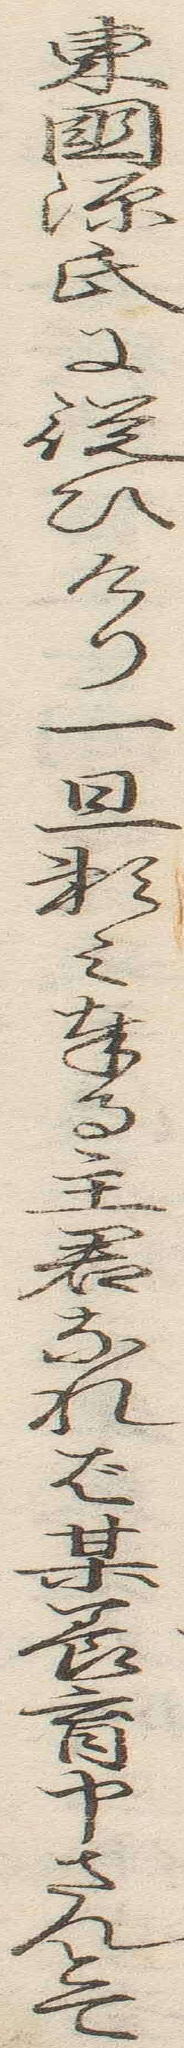東國源氏に従ひけり一旦頼み奉る主君なれば某養育申さんとて
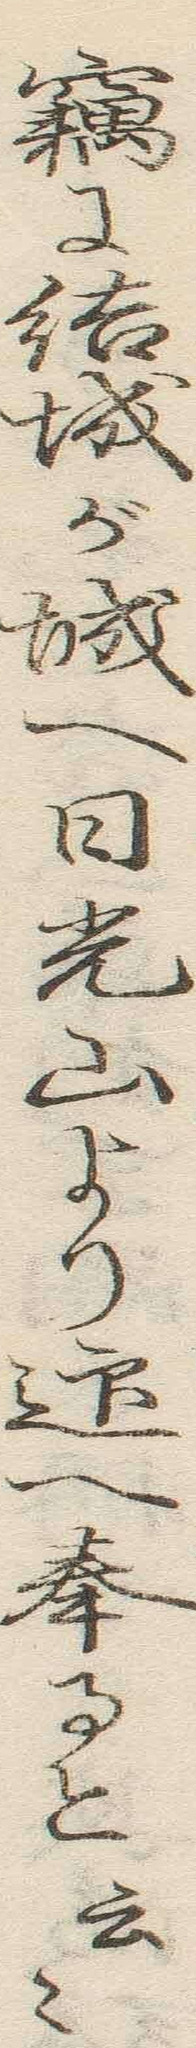竊に結城が城へ日光山より迎へ奉ると云〻
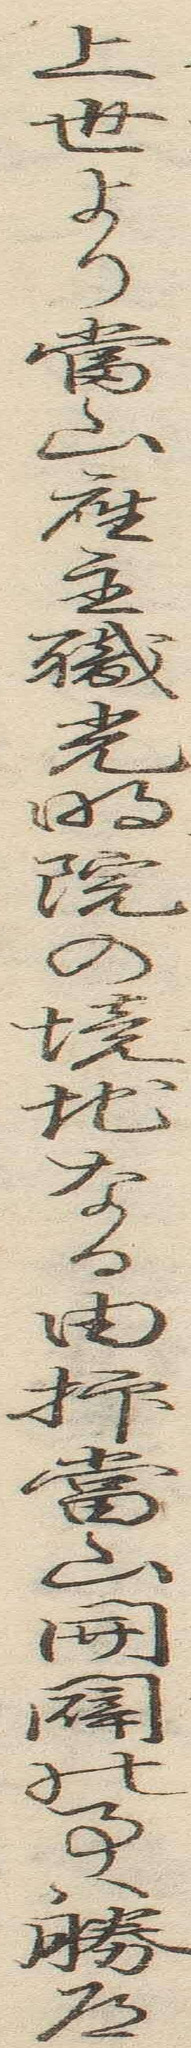上世より當山座主職光明院の境地なる由抑當山開闢の事は勝道

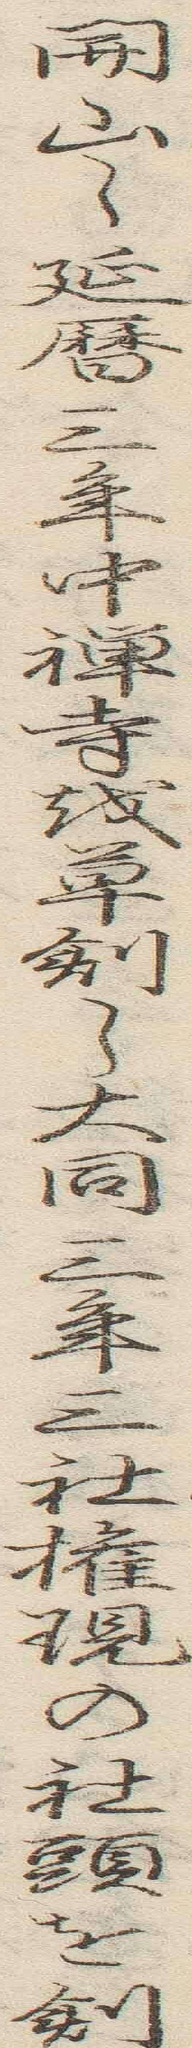開山し延曆三年中禅寺を草創し大同三年三社権現の社頭を創
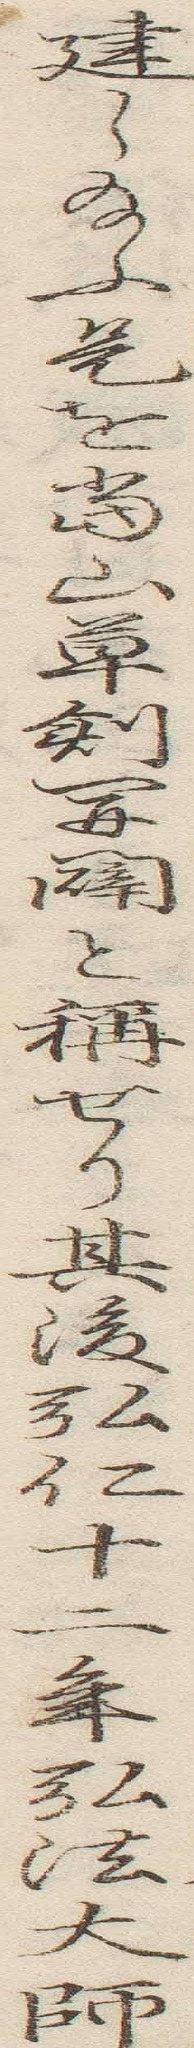建し給ふ是を當山草創開闢と稱せり其後弘仁十二年弘法大師
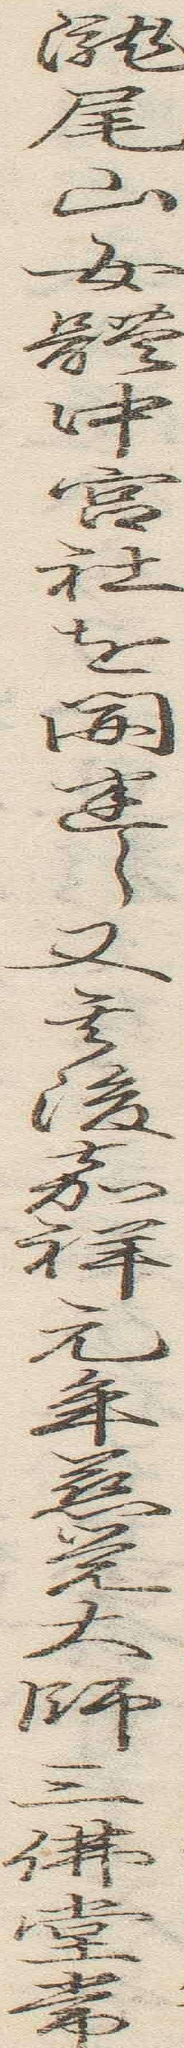瀧尾山如體中宮社を開建し又其後嘉祥元年慈覚大師三佛堂常
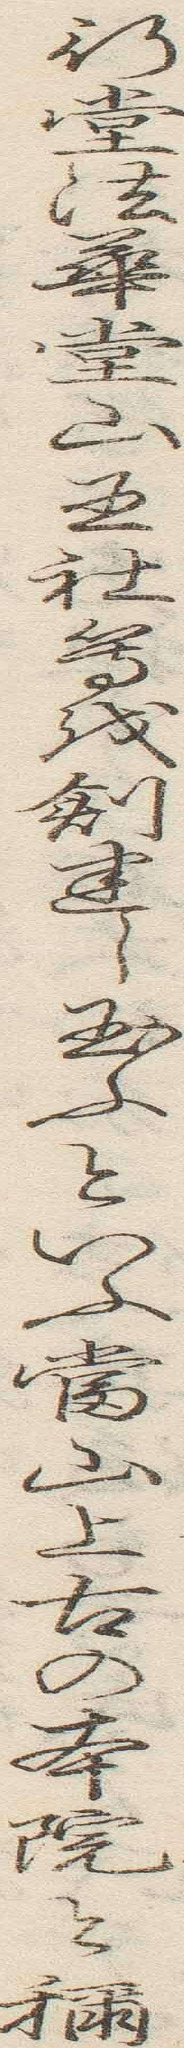行堂法華堂山王社等を創建し玉ふといふ當山上古の本院と稱
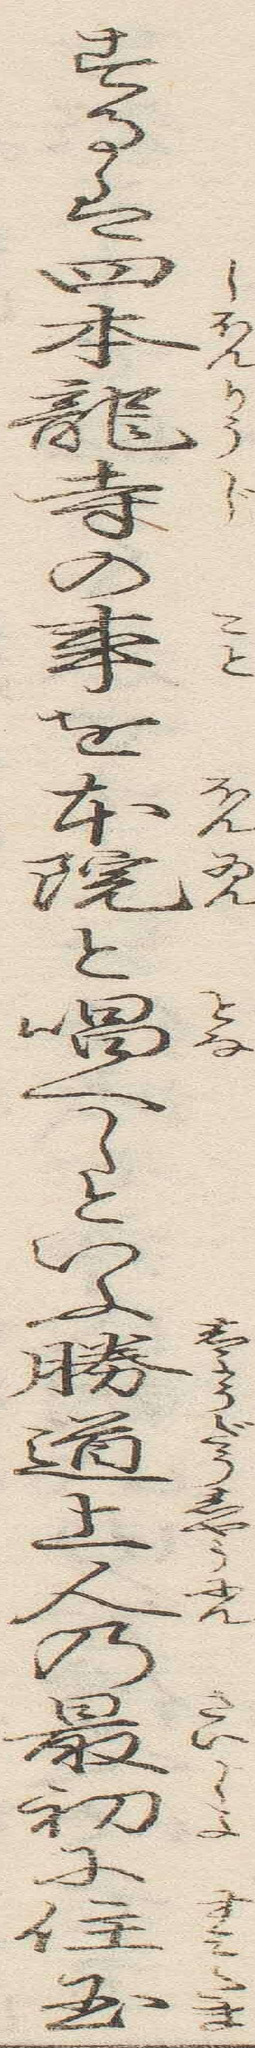するは四本龍寺の事を本院と唱へしといふ勝道上人の最初に住玉
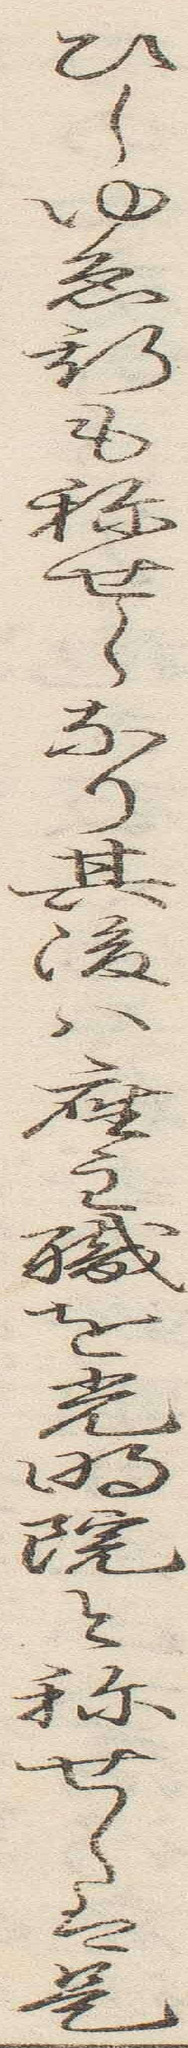ひしゆゑ斯も称せしなり其後は座主職を光明院と称せしは是
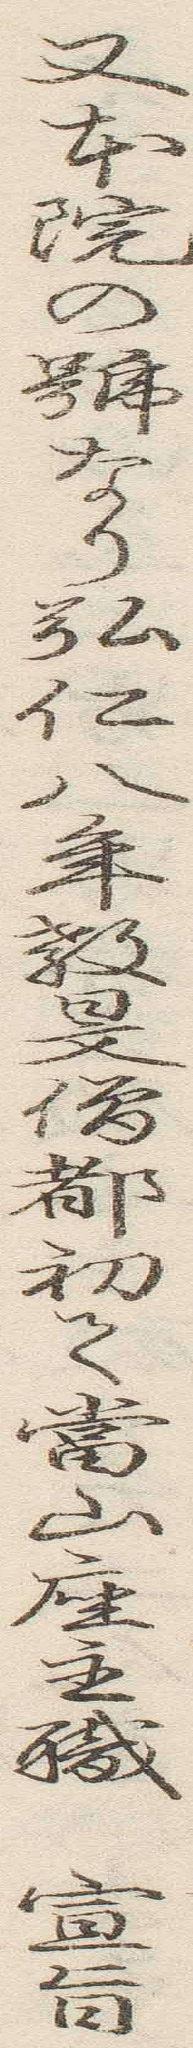又本院の號なり弘仁八年敎旻僧都初て當山座主職宣旨
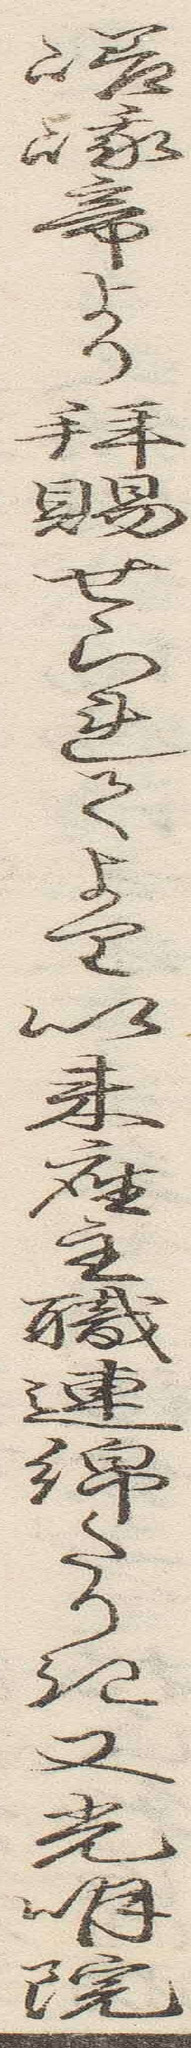嵯峨帝より拜賜せられてより以来座主職連綿たりき又光明院
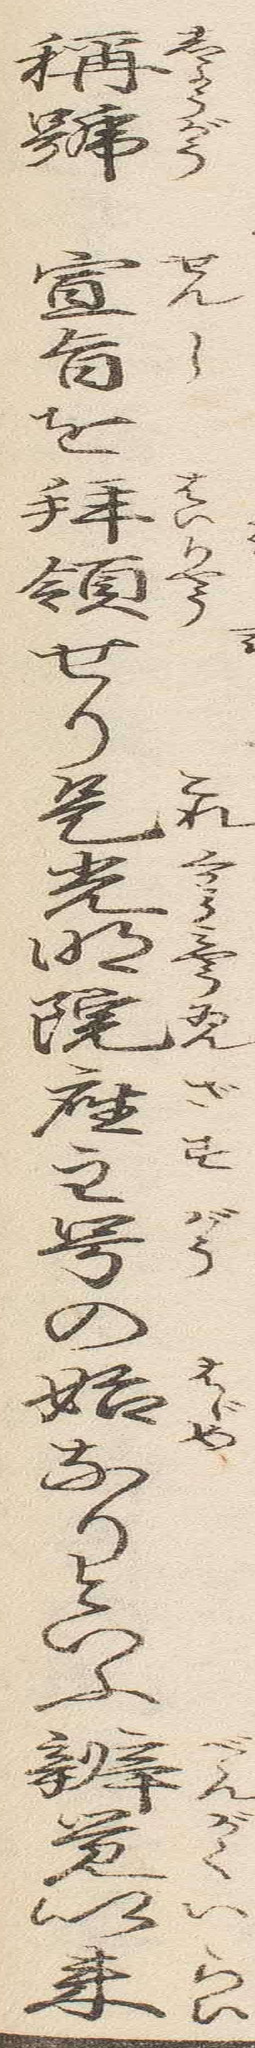稱號宣旨を拜領せり是光明院座主号の始なりといふ辨覚以来
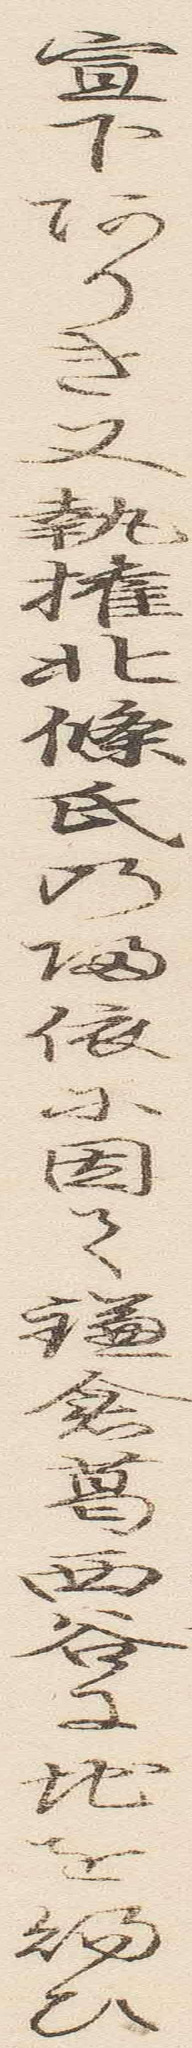宣下ありき又執権北條氏の帰依に因て鎌倉葛西谷に地を賜ひ
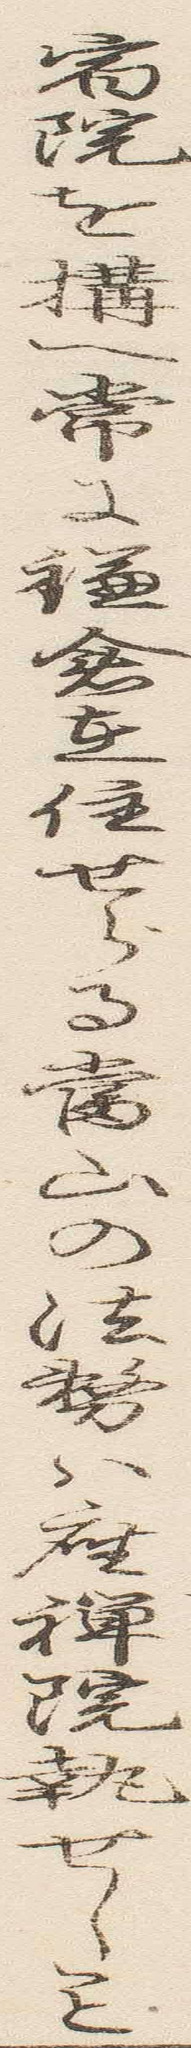宿院を構へ常に鎌倉在住せらる當山の法務は座禅院執せしこと
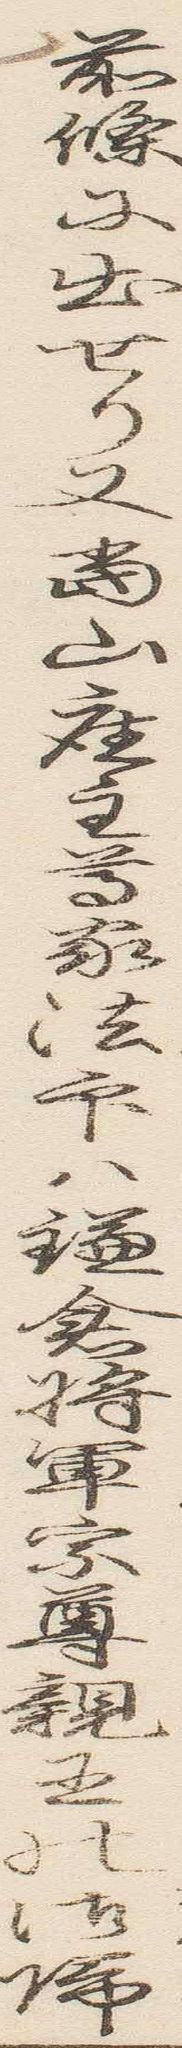前條に出せり又當山座主尊家法印は鎌倉将軍宗尊親王の御帰
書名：日光山志
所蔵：東京学芸大学附属図書館 国文学研究資料館
